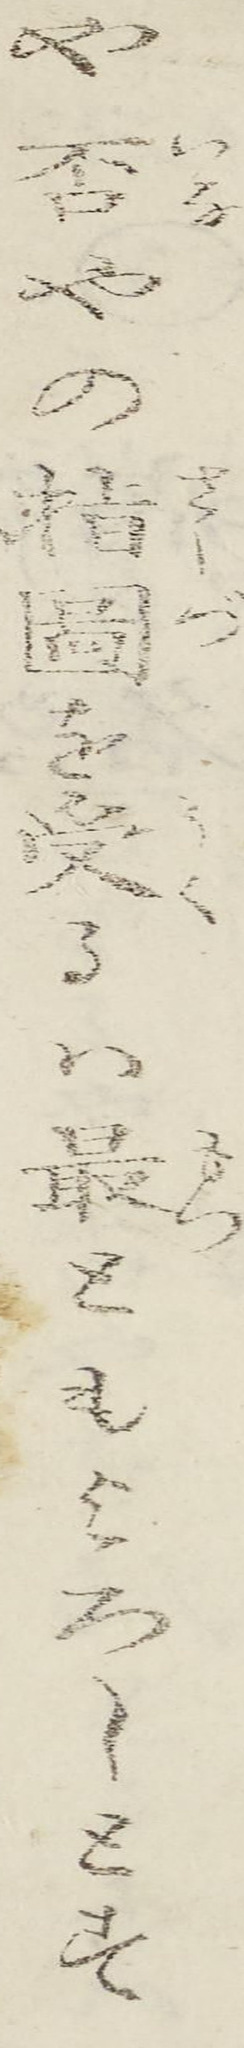や否やの指図を受るは最ともよろしとす

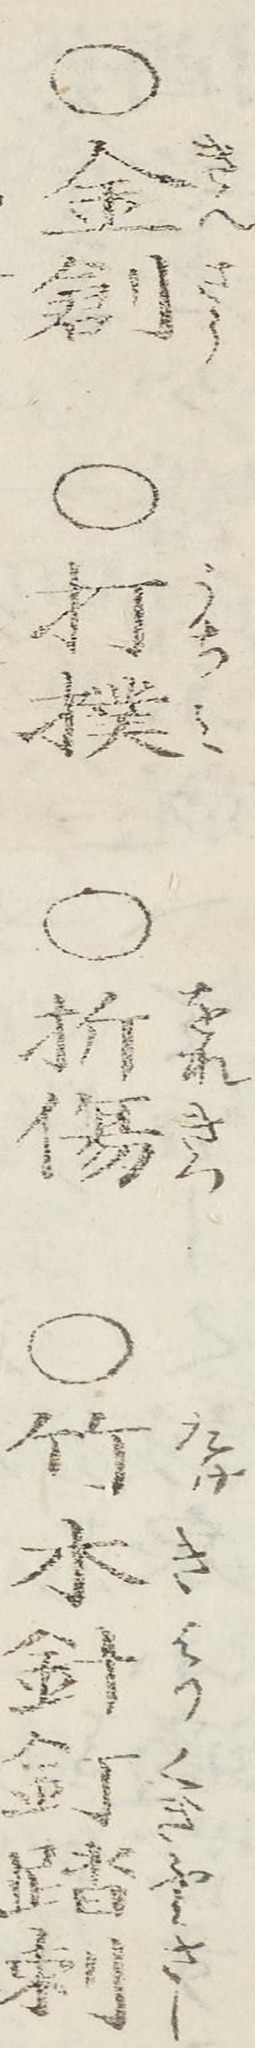〇金創〇打撲〇折傷〇竹木針釘踏刺
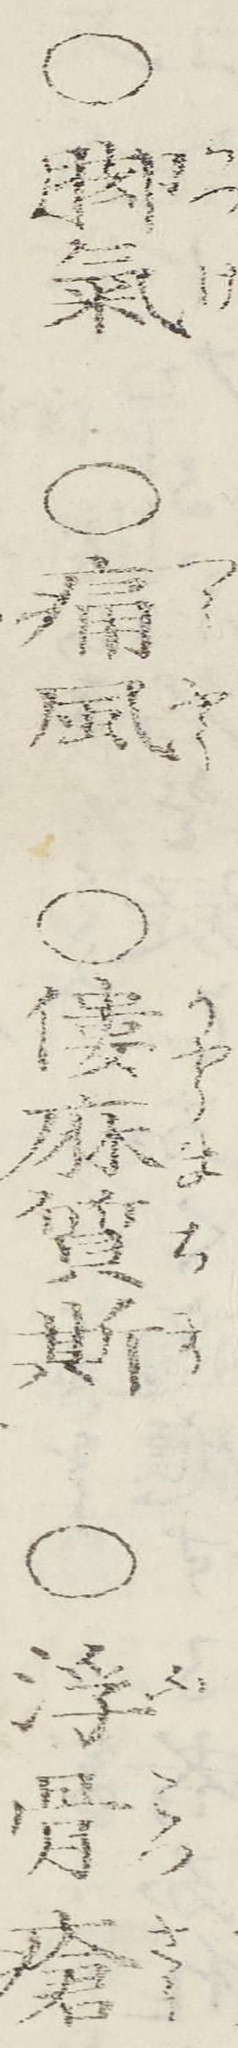〇脚気〇痛風〇僂麻質斯〇浮骨瘡
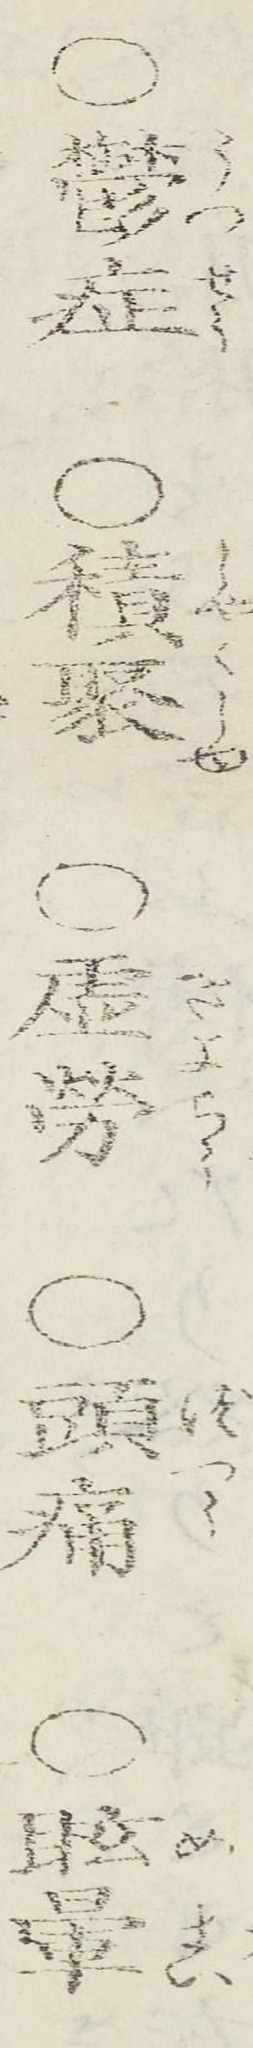〇鬱症〇積聚〇虚労〇頭痛〇眩暈
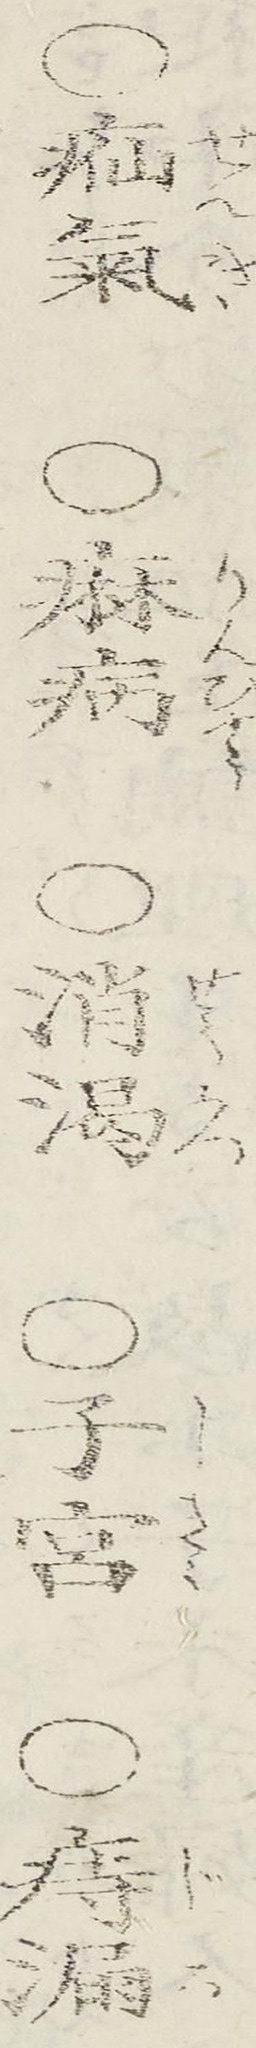〇疝気〇痳病〇消渇〇子宮〇痔漏
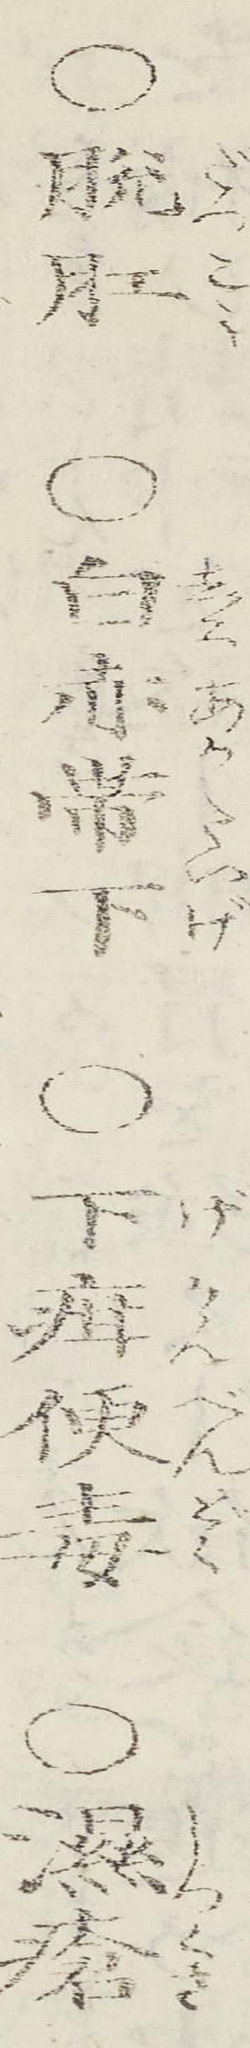〇脱肛〇白赤帯下〇下疳便毒〇湿瘡
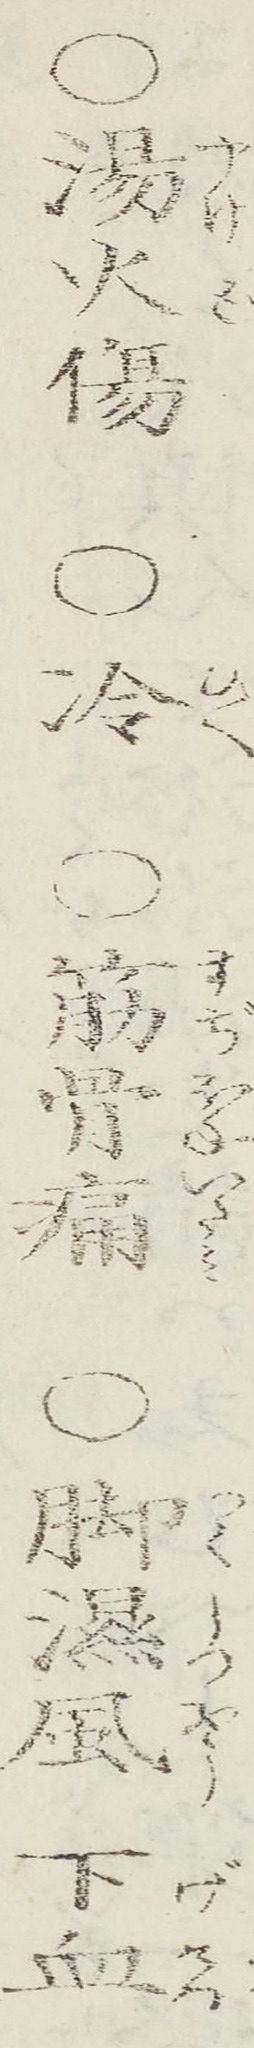〇湯火傷〇冷〇筋骨痛〇脚湿風下血
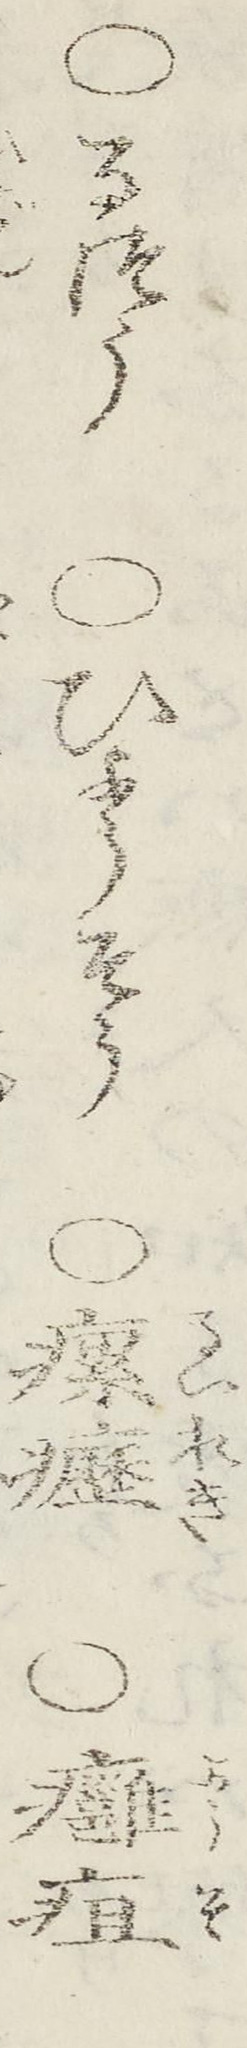〇るつう〇ひようそう〇瘰癧〇癰疽
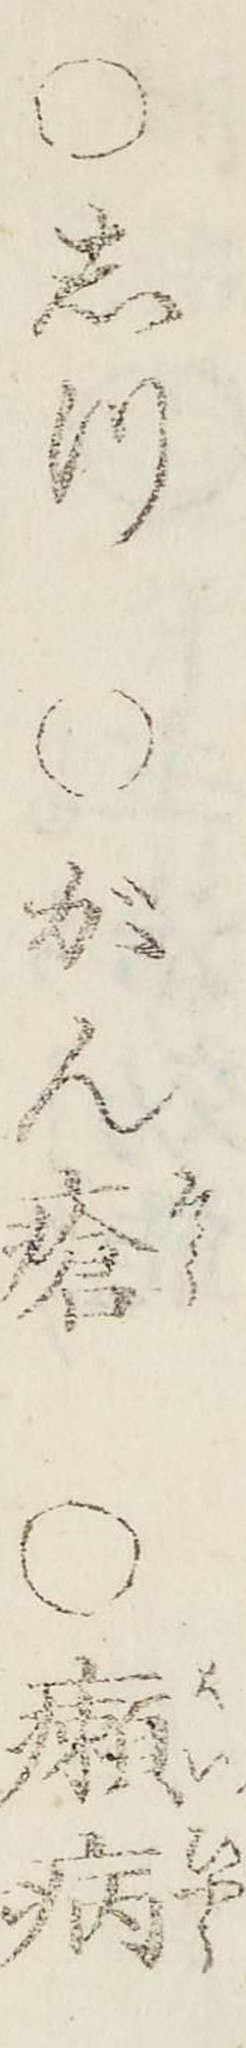〇しつ〇がん瘡〇癩病
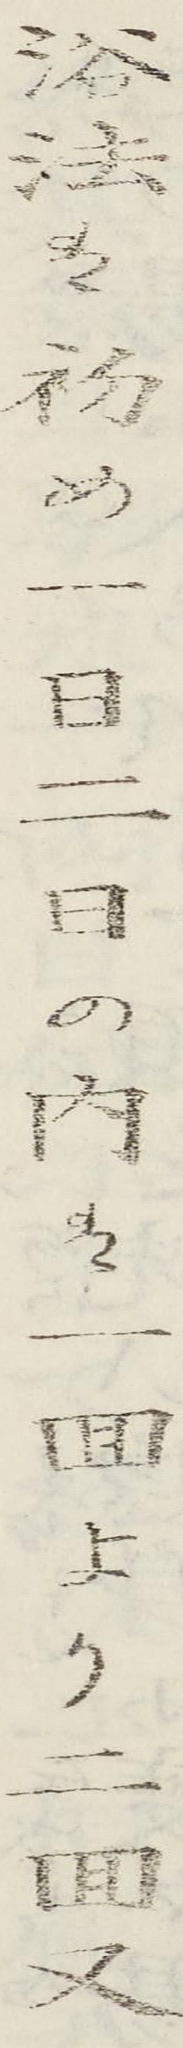浴法は初め一日二日の内は一回より二回又
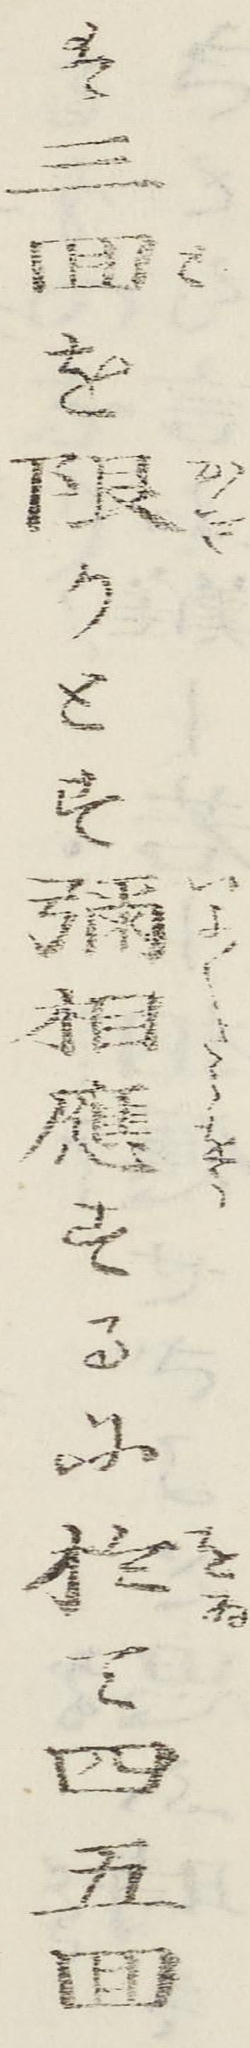は三回を限りとす弥相応するに於て四五回
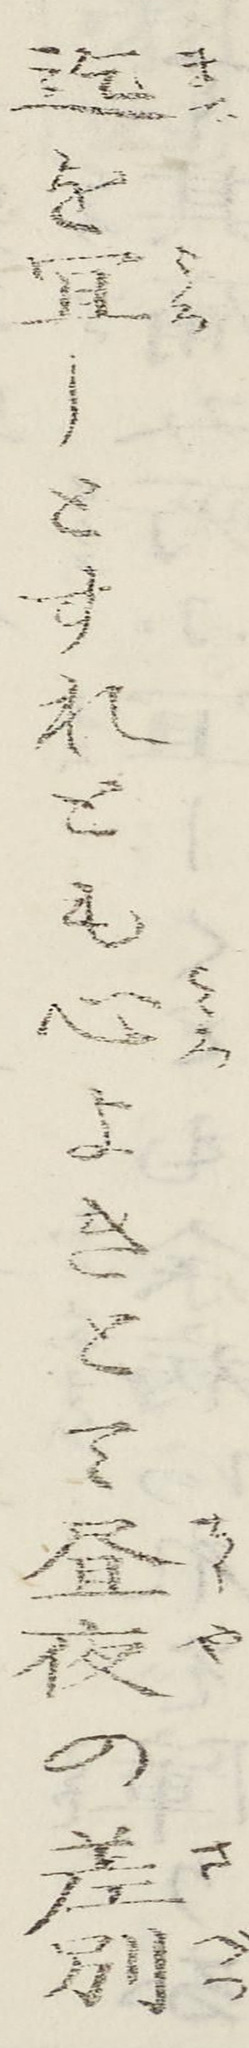迄を宜しとすれとも心よきとて昼夜の差別
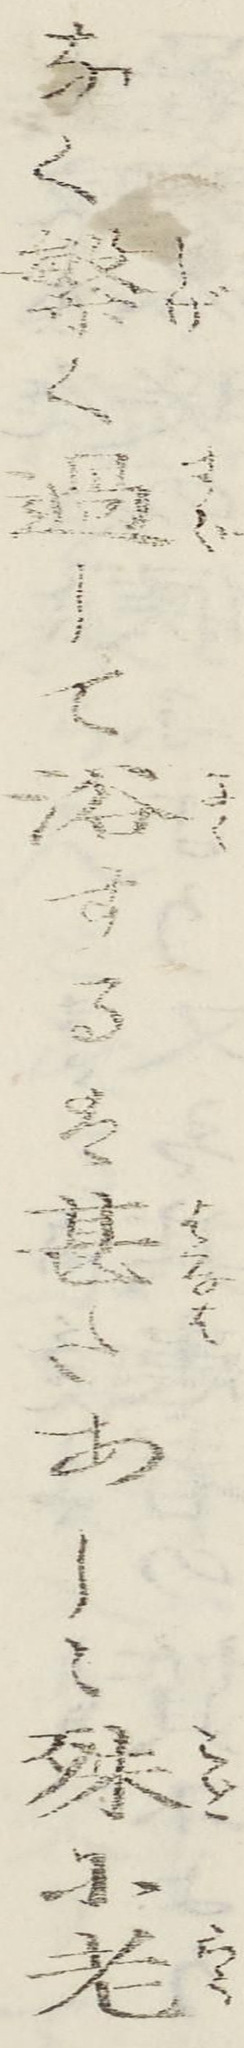なく繁く過して浴するは甚たあしゝ殊に老
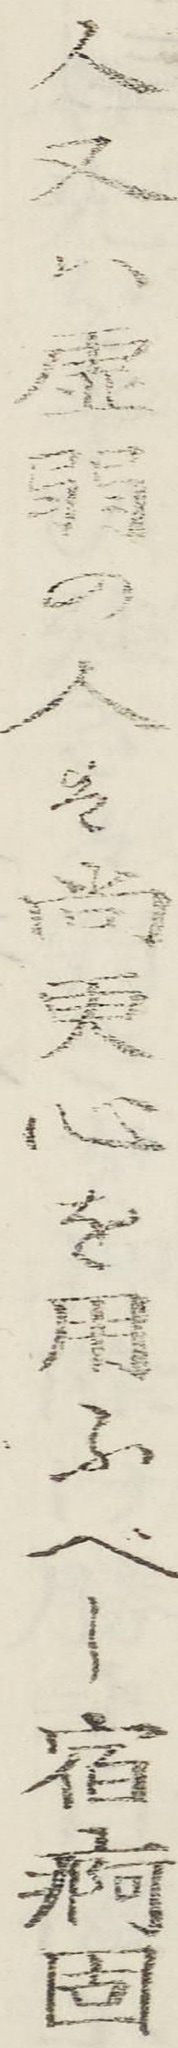人又は虚弱の人は尚更心を用ふべし宿痾固
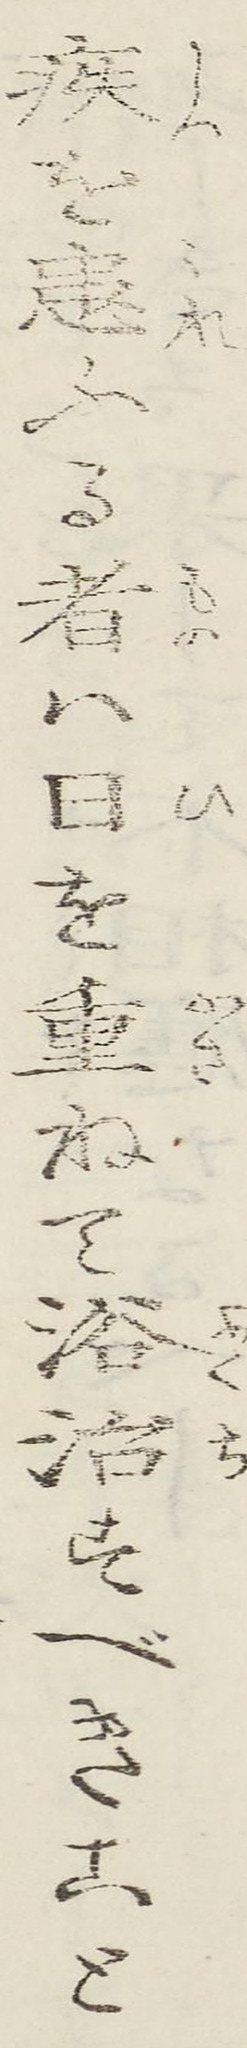疾を患ふる者は日を重ねて浴治すべきこと
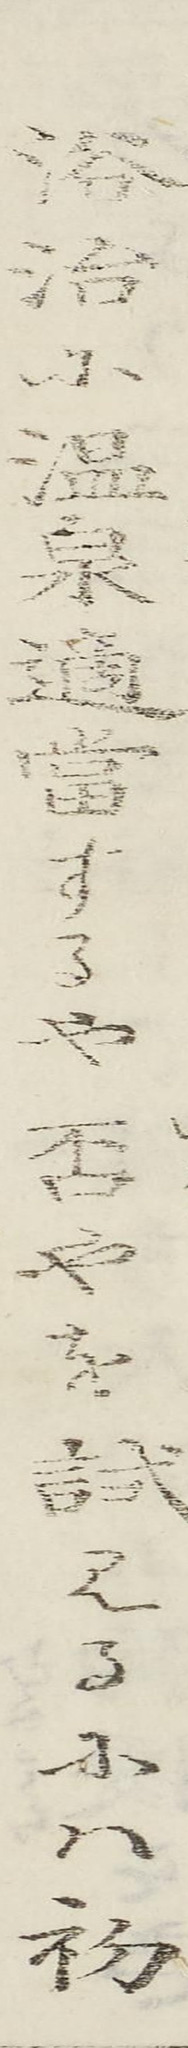浴治に温泉適当するや否やを試みるには初
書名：鎌先温泉由來記
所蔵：東京大学地震研究所図書室 Earthquake Research Institute Library, The University of Tokyo, JAPAN
